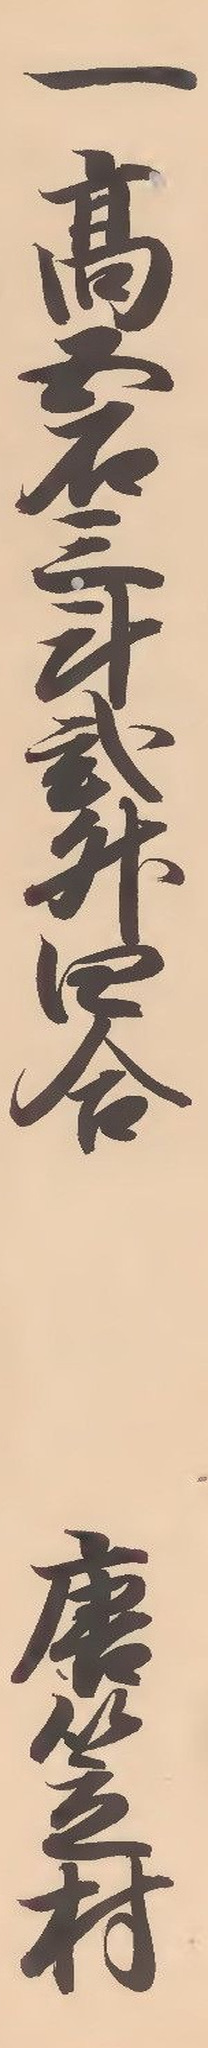一高五石三斗弐升四合唐笠村
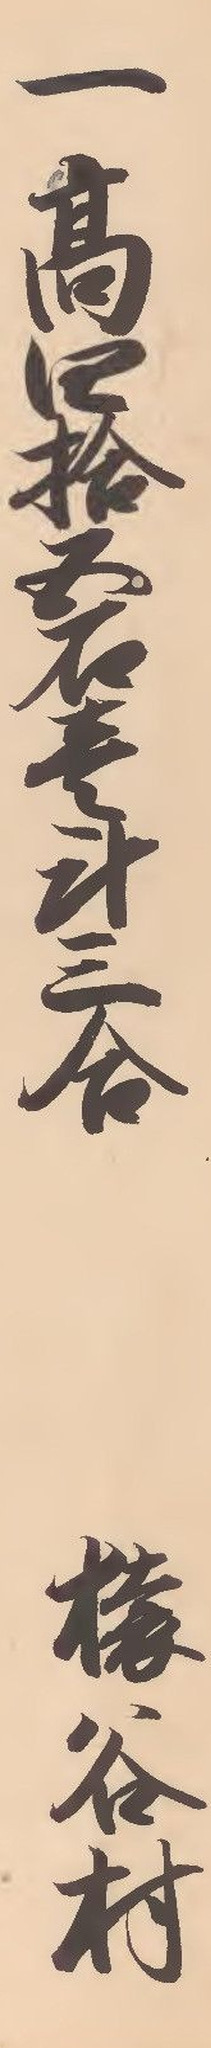一高四拾五石壱斗三合猿谷村
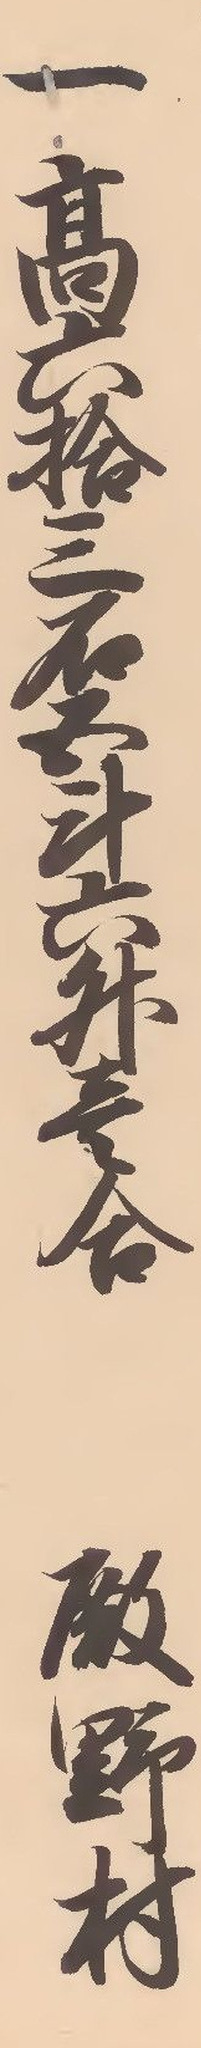一高六拾三石五斗六升壱合殿野村
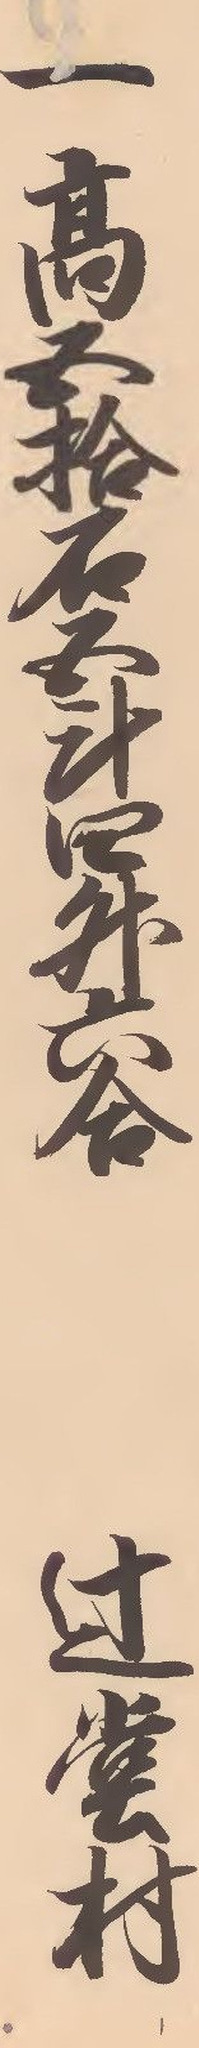一高五拾石五斗四升六合辻堂村
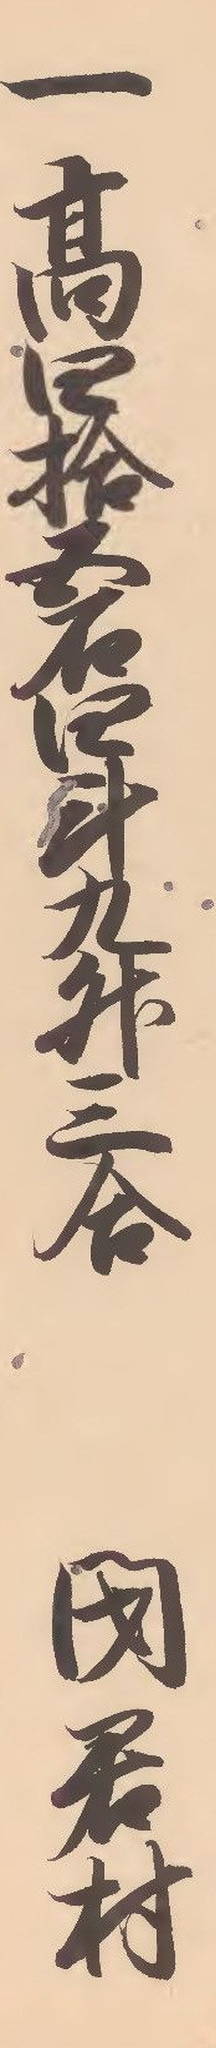一高四拾五石四斗九升三合閉君村

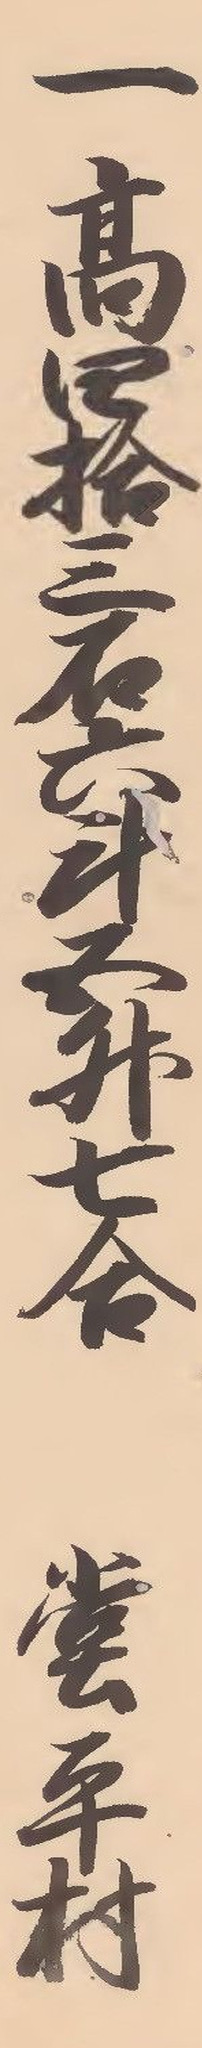一高四拾三石六斗五升七合堂平村
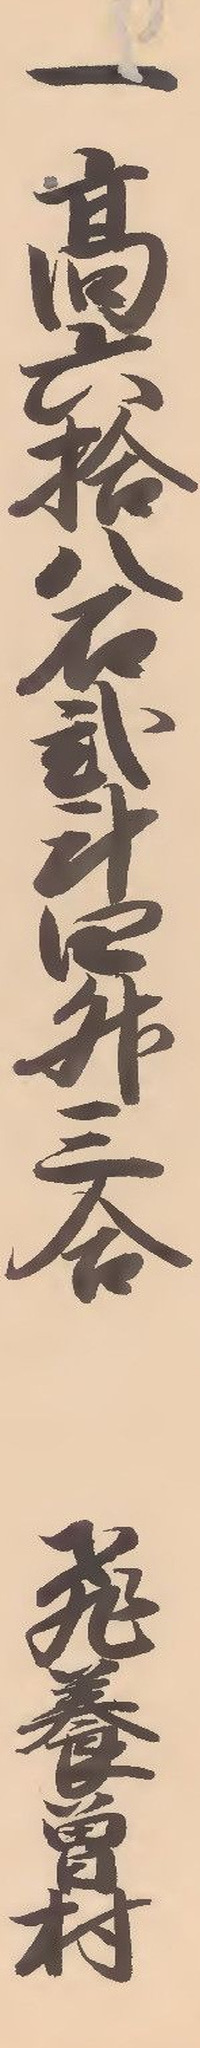一高六拾八石弐斗四升三合飛養曽村
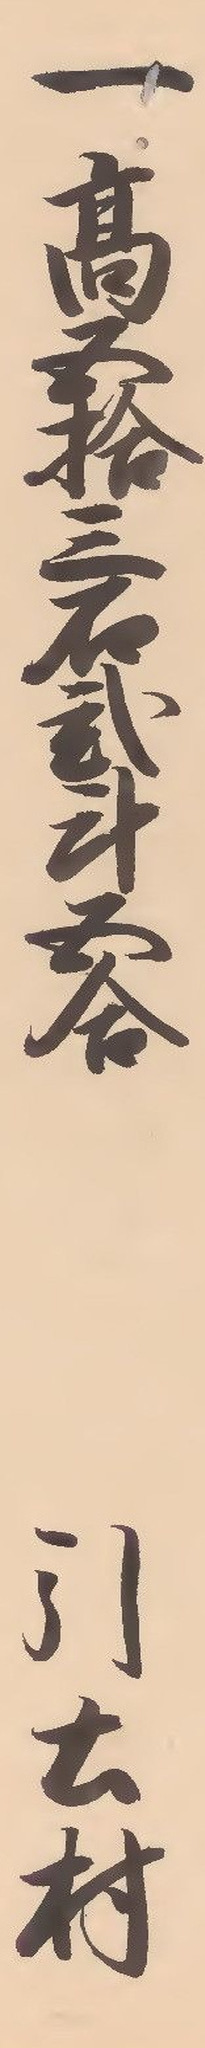一高五拾三石弐斗五合引土村
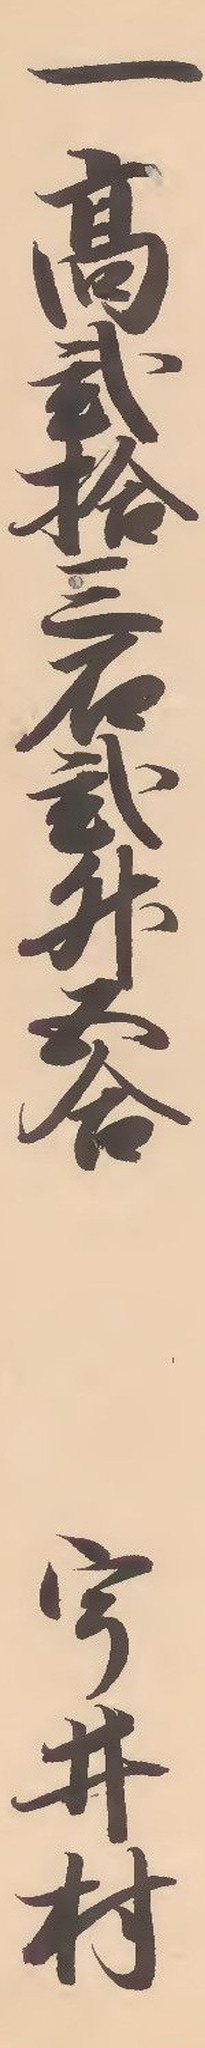一高弐拾三石弐升五合宇井村
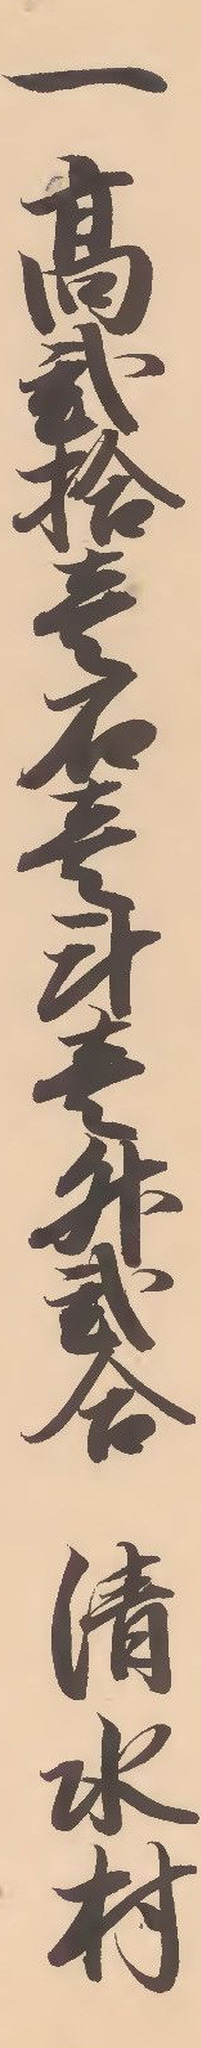一高弐拾壱石壱斗壱升弐合清水村
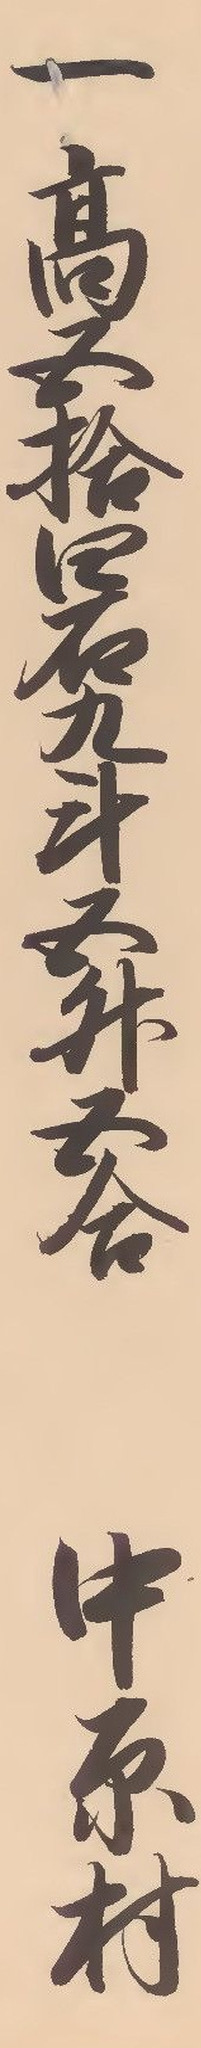一高五拾四石九斗五升五合中原村
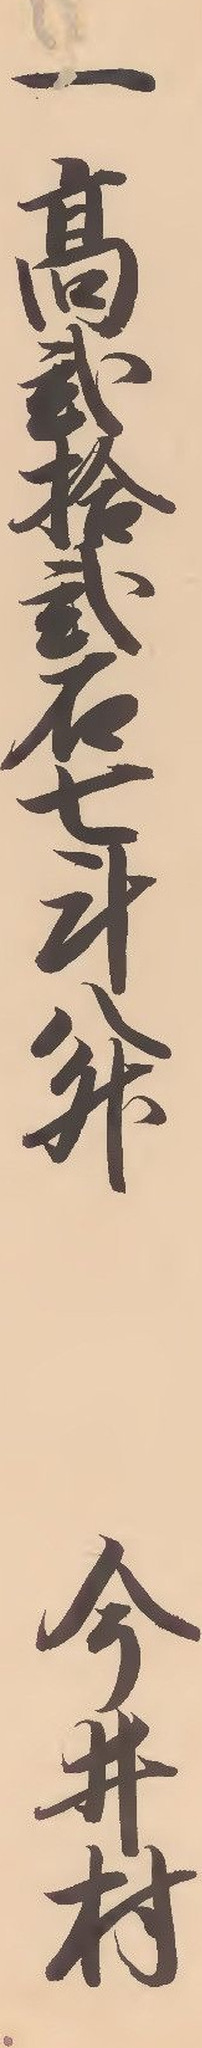一高弐拾弐石七斗八升今井村

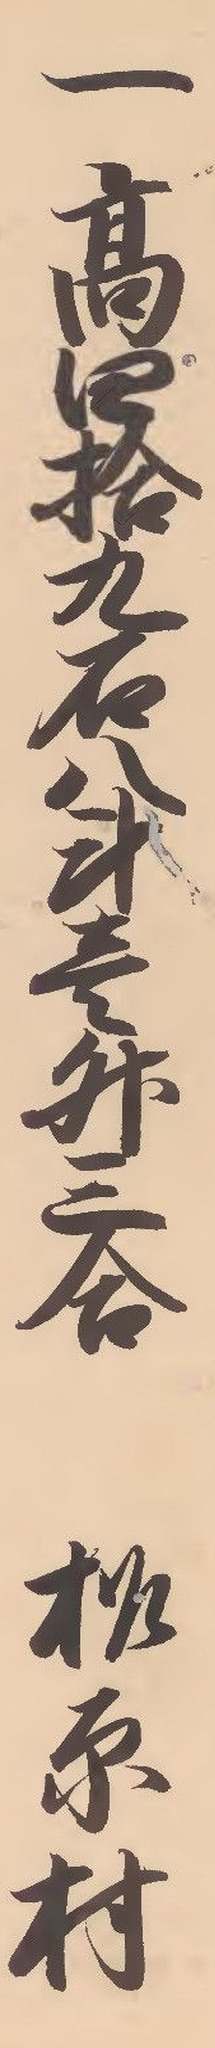一高四拾九石八斗壱升三合柞原村
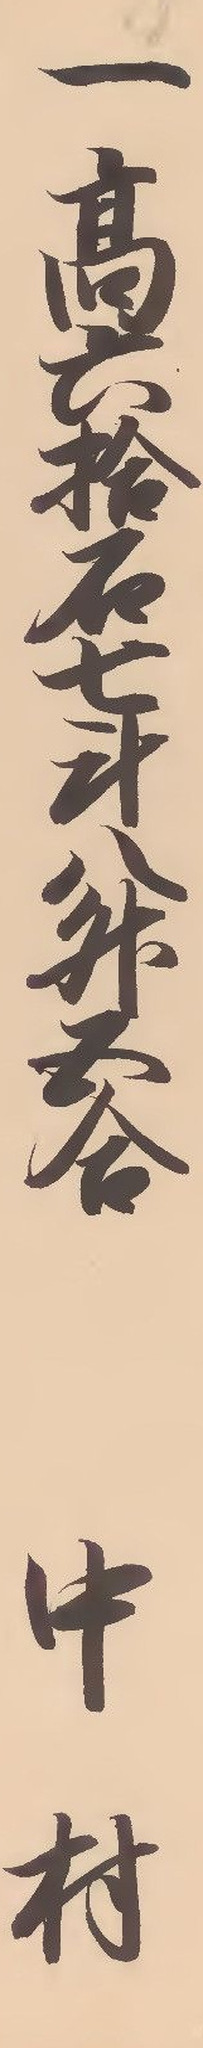一高六拾石七斗八升五合中村
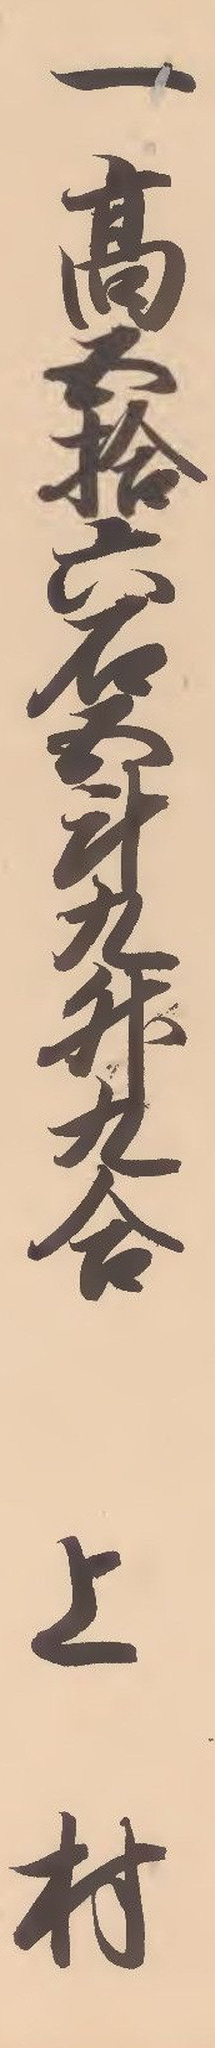一高五拾六石五斗九升九合上村
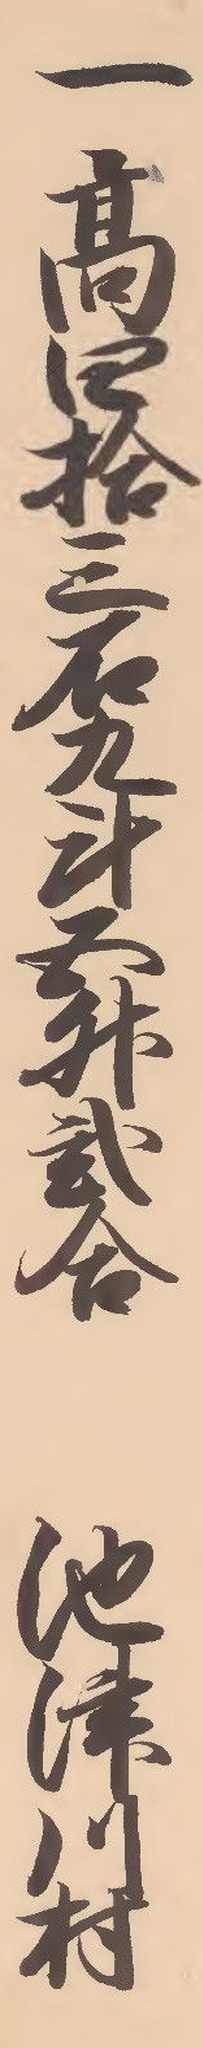一高四拾三石九斗五升弐合池津川村
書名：大和国郷帳
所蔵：国立公文書館 National Archives of Japan
